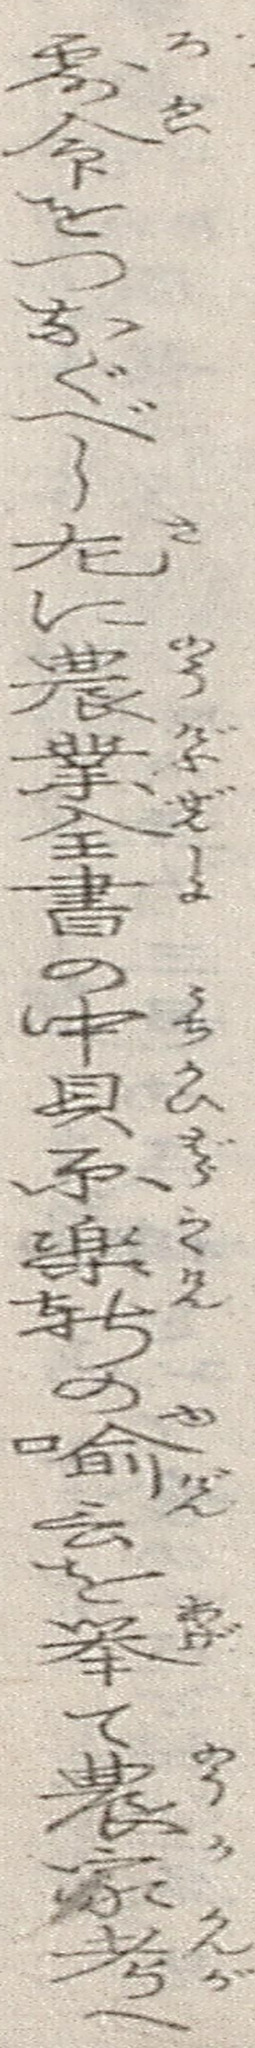露命をつなぐべし左に農業全書の中貝原楽軒の喩言を挙て農家考へ
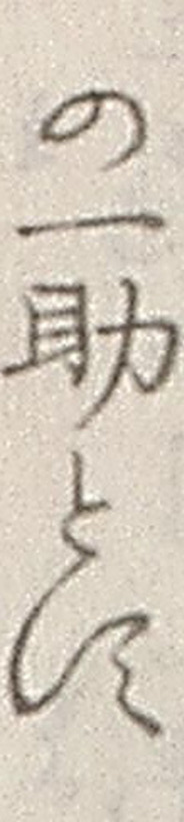の一助とす
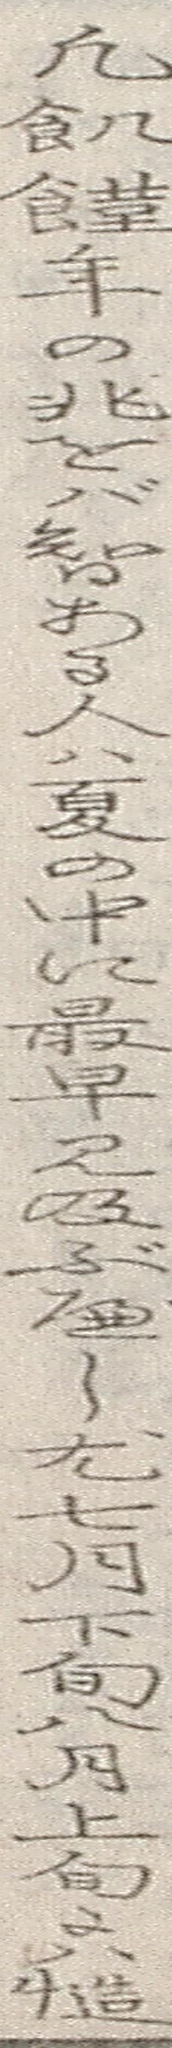凡飢饉年の兆をば智ある人は夏の中に最早見及ぶべし尤七月下旬八月上旬には慥
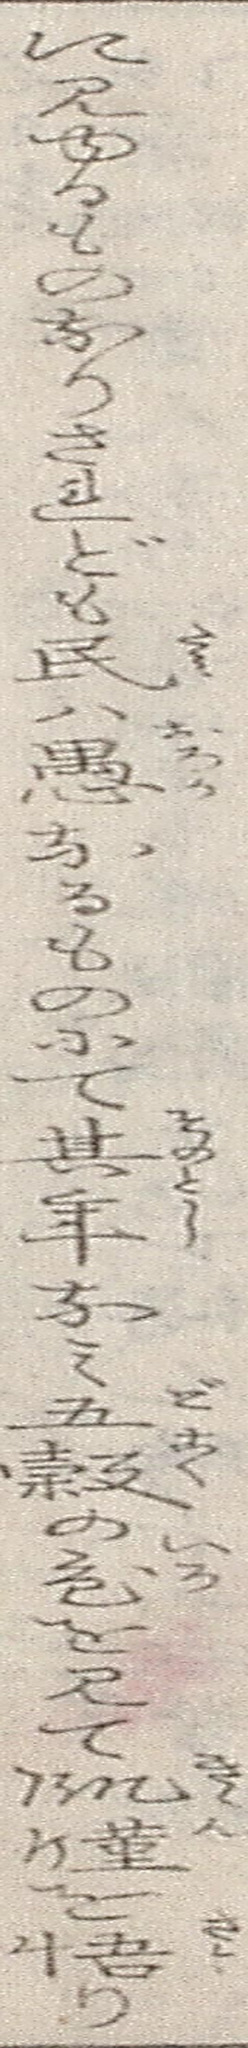に見ゆるものなりされども民は愚なるものにて其年なみ五穀の色を見て飢饉を悟り
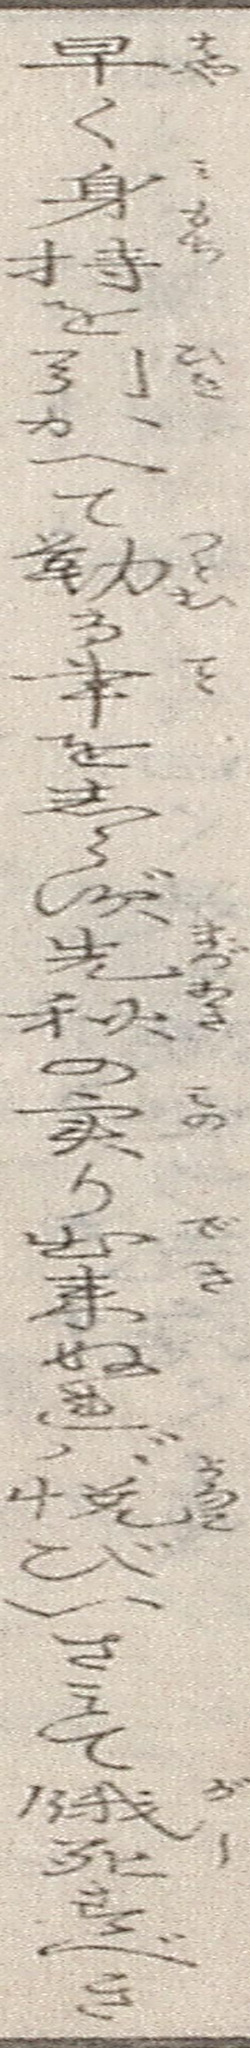早く身持を引かへて勤る事をしらず先秋の実り出来ぬれば悦びいさみて餓死すべき
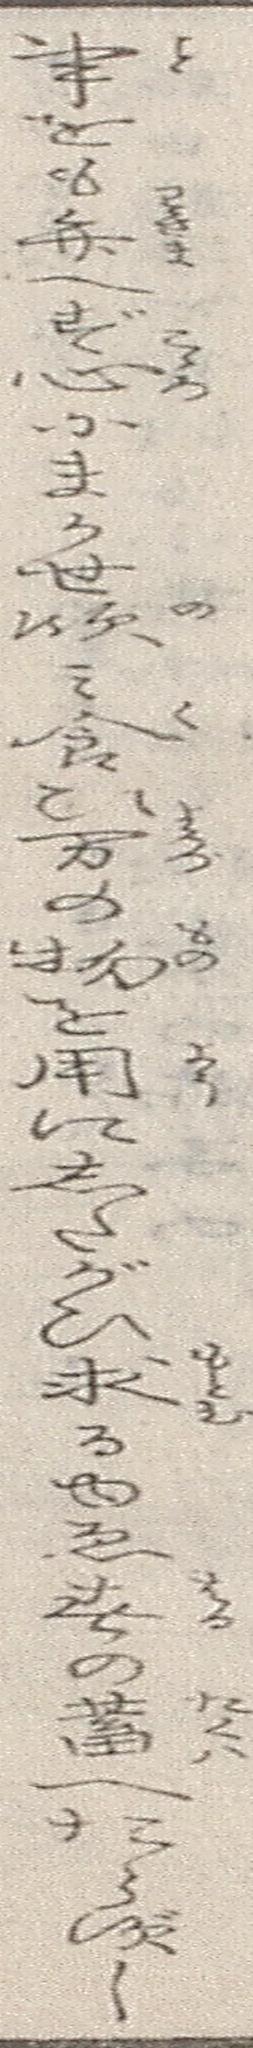事をも弁へず心にまかせ飲み食ひ万の物を用にしたがひ求るゆゑ春の蓄へたらずし
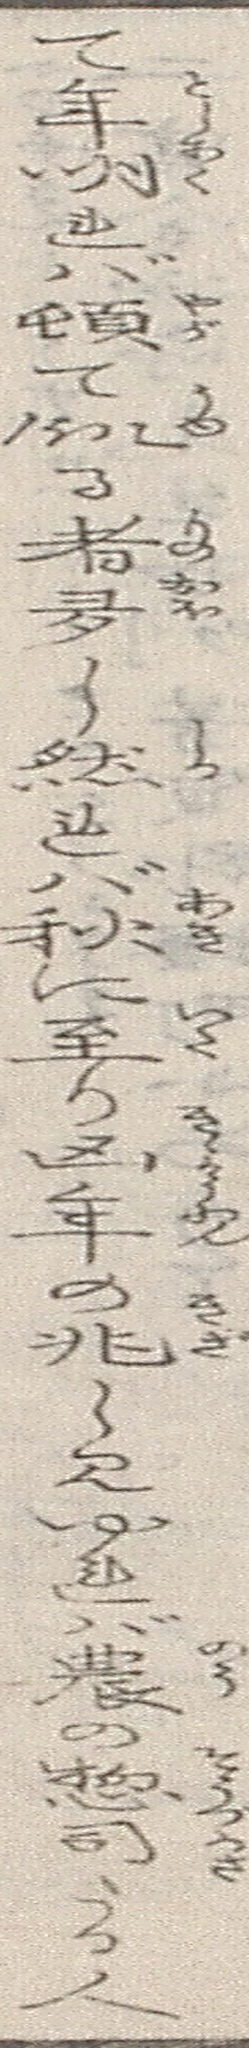て年明れば頓て飢る者多し然れば秋に至り凶年の兆し見ゆれば農の惣司たる人
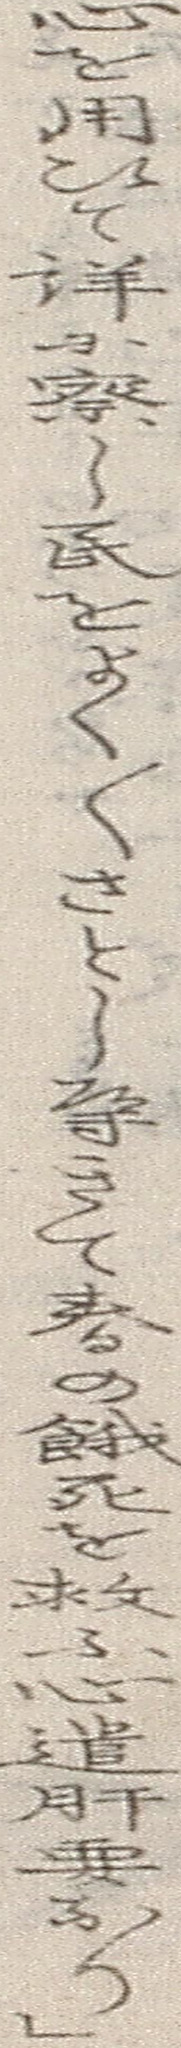心を用ひて詳に察し民をよく〳〵さとし導きて春の餓死を救ふ心遣肝要なり」
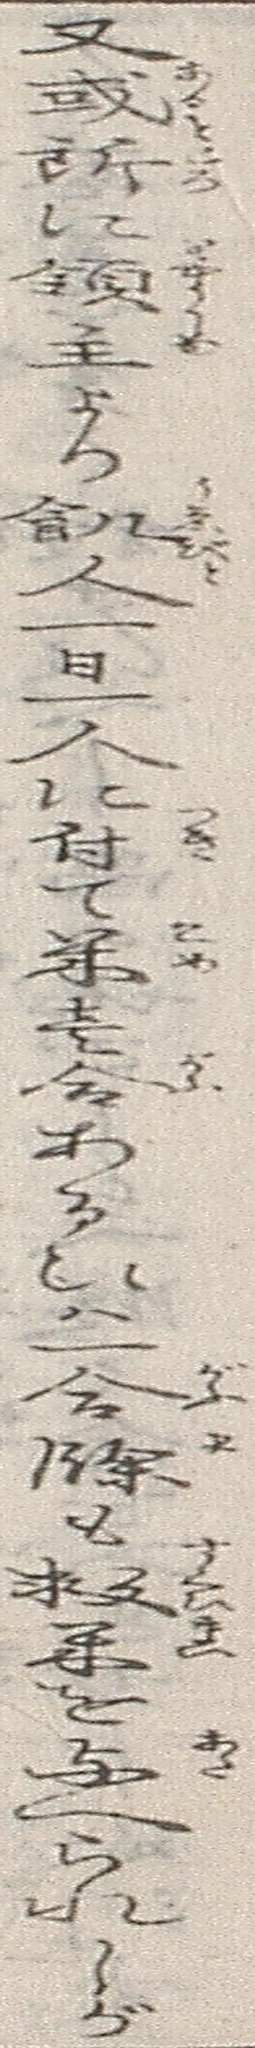又或所に領主より飢人一日一人に付て米壱合あるひは一合余も救米を与へられしが
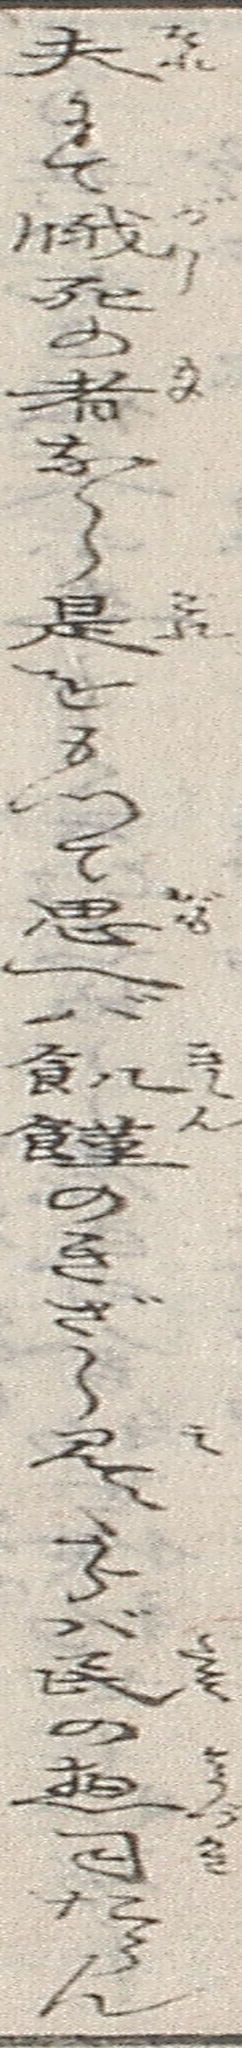夫にて餓死の者なし是をもつて思へば飢饉のきざし見えたらば民の惣司たらん
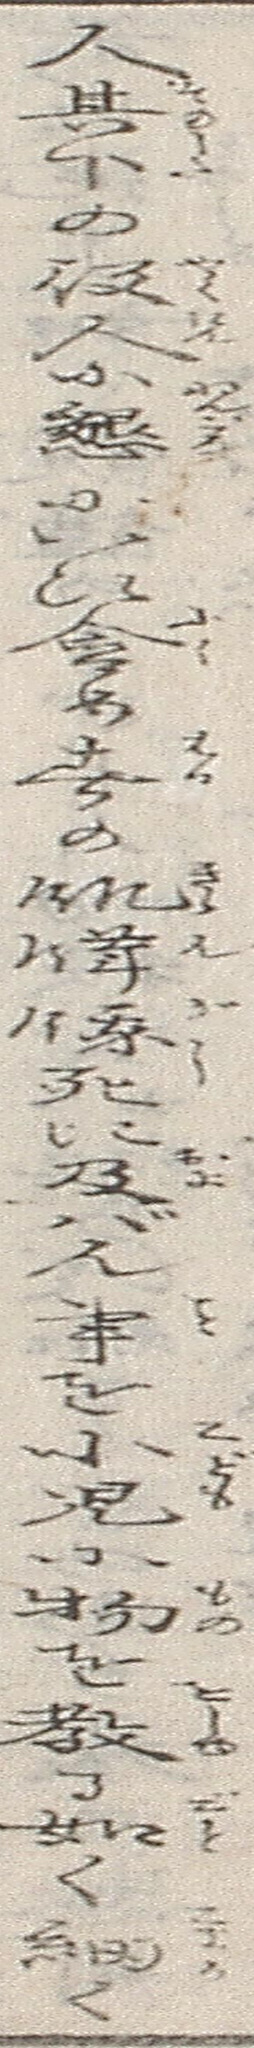人其下の役人に懇にいひ含め春の飢饉餓死に及ばん事を小児に物を教る如く細く
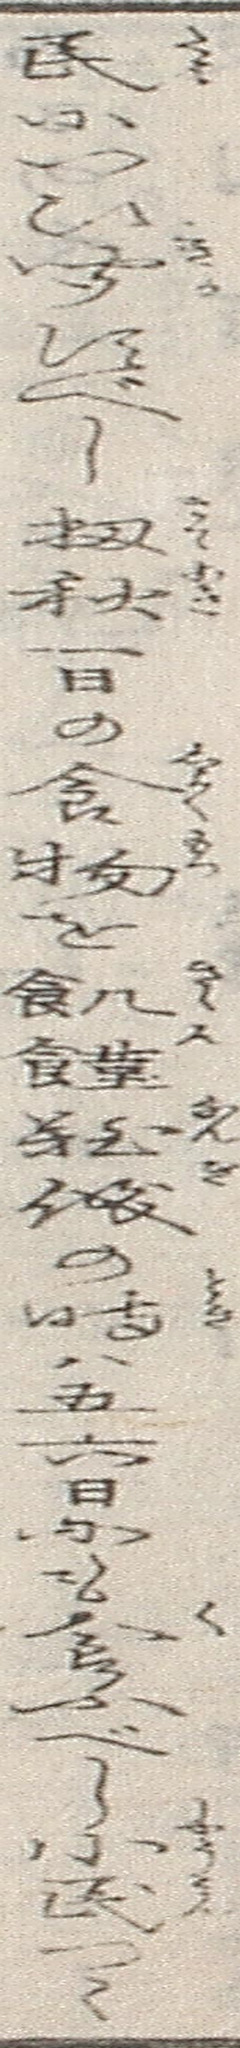民にいひ聞すべし扨秋一日の食物を飢饉難儀の時は五六日にも食ふべし小民つく
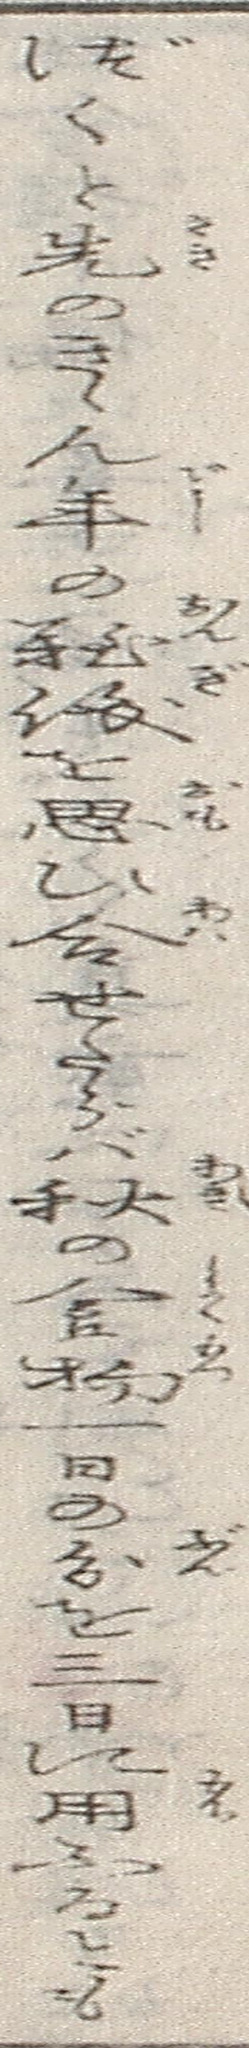づくと先のきゝん年の難儀を思ひ合せたらば秋の食物一日の分を三日に用ふるとも
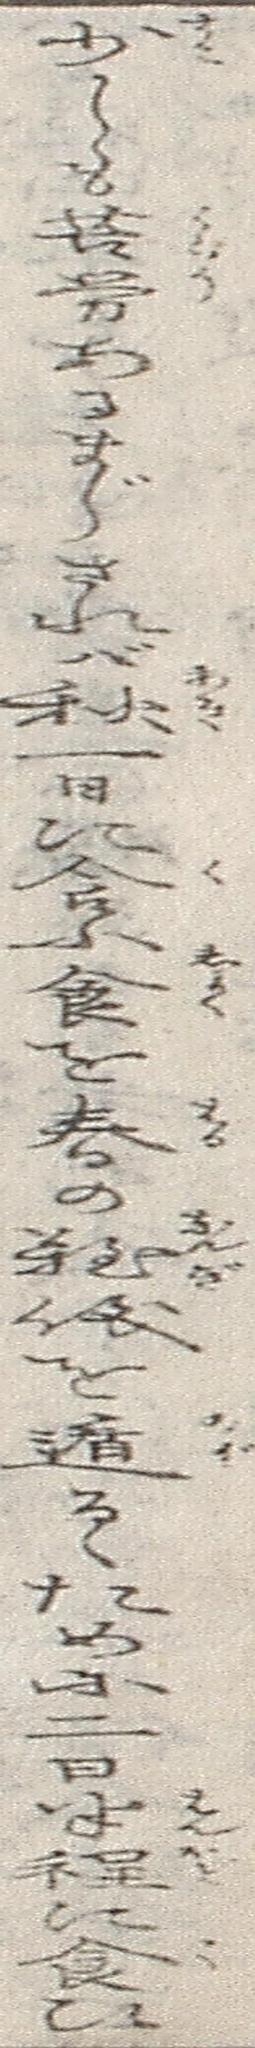少しも苦労あるまじされば秋一日に食う食を春の難儀を遁るゝために二日半程に食ひ
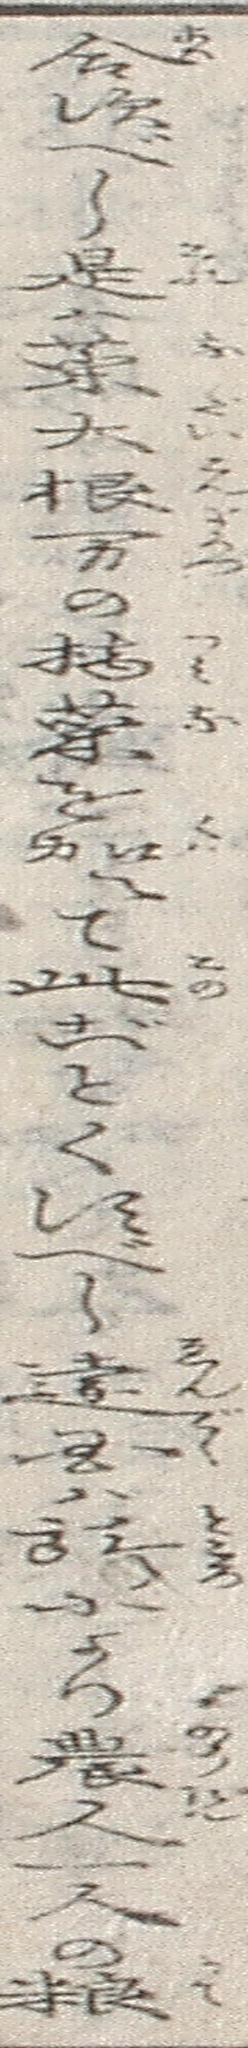合すべし是は菜大根万の摘菜を加へて此ごとくにすべし遠国は所により農人一人の粮
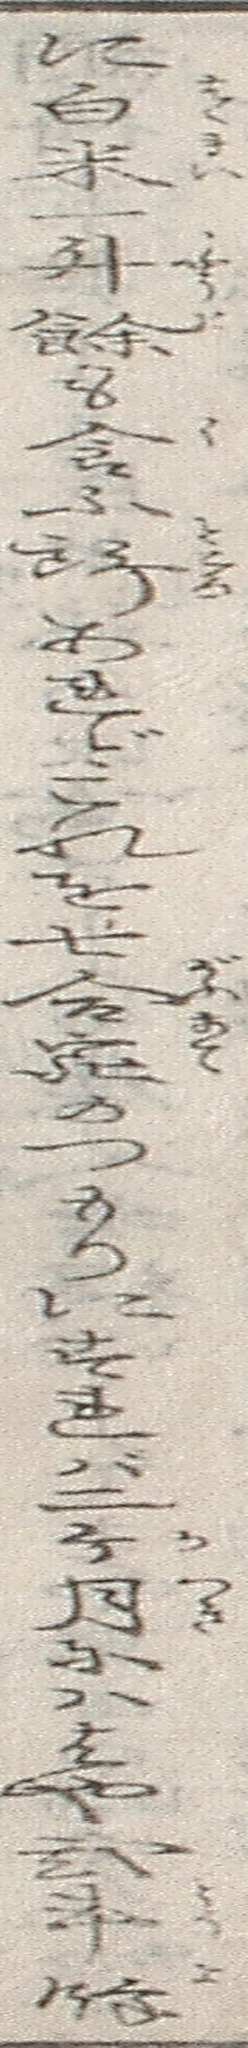に白米一升余も食ふ所あれどこれを七合宛のつもりにすれば二ケ月かつきにははや弐斗余
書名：凶荒図録　完
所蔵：東京大学地震研究所図書室 Earthquake Research Institute Library, The University of Tokyo, JAPAN
